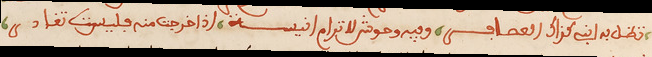تظل به ابنى كذلك العصافر وفيه وحوش لا ترام انيسة اذا خرجت منه فليست تغادر
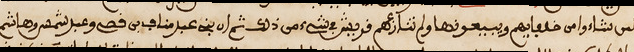لمن شاءوا من خلفايهم ويبيعونها ولم تنازعهم قريش في شيء من ذلك ثم ان بنى عبد مناف بن قصى وعبد شمس وهاشم
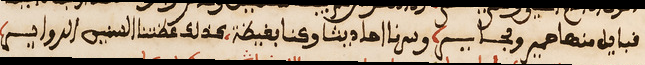قبايل منها حمير وبحاير وسرنا احاديثا وكنا بغيظة كذلك عظتنا السنين الدواير
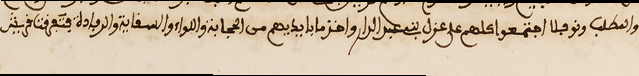والمطلب ونوفلا اجتمعوا كلهم على عزل بنى عبد الدار واخذ ما بايديهم من الحجابة واللواء والسقاية والرفادة فتفرقت قريش
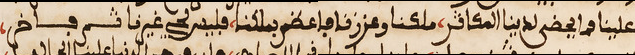علينا فما يحضى لدينا المكاثر ملكنا وعززنا فاعظم بملكنا فليس لحي غيرنا ثم فاخر
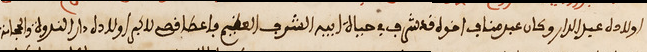أولاده عبد الدار وكان عبد مناف اخوه قد شرف في حياة ابيه الشرف العظيم فاعطا قصى لاكبر أولاده دار الندوة والحجامة
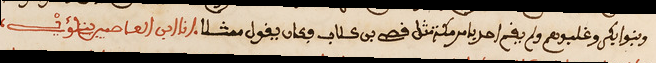وبنوا بكر وغلبوهم ولم يقم احد بامر مكة مثل قصى بن كلاب فكان يقول ممثلا انا ابن العاصمين بتؤيى
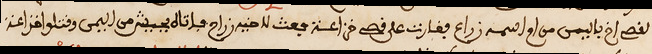لقصى اخ باليمن من ام اسمه زراع فغارت على قصى خزاعة بعث لاخيه زراح فاتاه بجيش من اليمن وقتلوا خزاعة
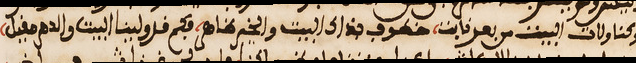وكنا ولات البيت من بعد نابت حظوف بذلك البيت والخير ظاهر فكم قد ولينا البيت والدهر مقيل
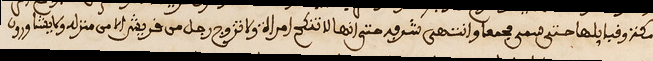مكة وقبائلها حتى سمى فجمعا وانتهى شرفه حتى انها لا تنكح امراة ولا تزوج رجل من قريش الا من منزله ولا يشاورون
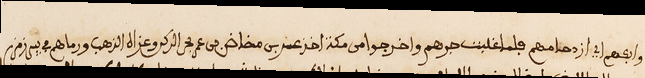وابكهم أي ازدحامهم فلما غلبت جرهم واخرجوا من مكة اخذ عسر بن مضاض بن عمر فجر الركن وعزاه الذهب ورماهم في بير زمزم
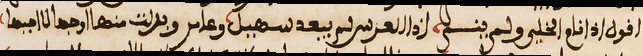أقول اذا نام الخلي ولم ينم اذا العرس لم يبعد سهيل وعامر وبدلت منها اوجها لا اميها
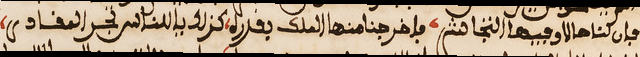فان لنا حالا وفيها التجاشر فاخرجنا منها الملك بقدره كذلك يا للناس تجد المقادر
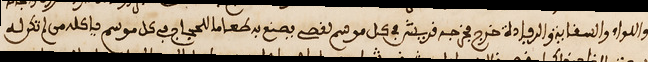واللواء والسقاية والرفادة خرج فخرجه قريش في كل موسم لقصى يصنع به طعاما للحجاج في كل موسم ياكله من لم تكن له
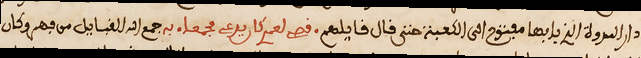دار المدوة الذي بابها مفتوح الى الكعبة حتى قال قايلهم قصى لعمرى كان يرعى فجمعاء به جمع الله القبايل من فهر وكان
